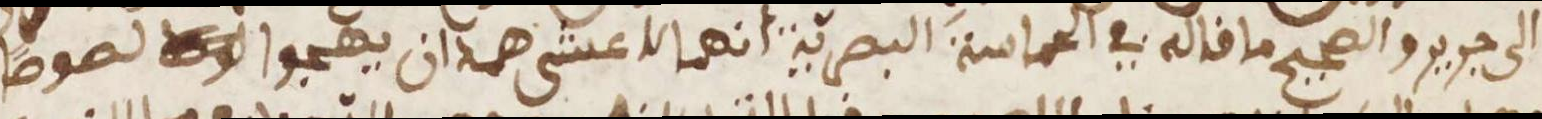الى جرير و الصحيح ما قاله في الحماسة البصرية أنهما لاعشى همدان يهجوا لصوصا
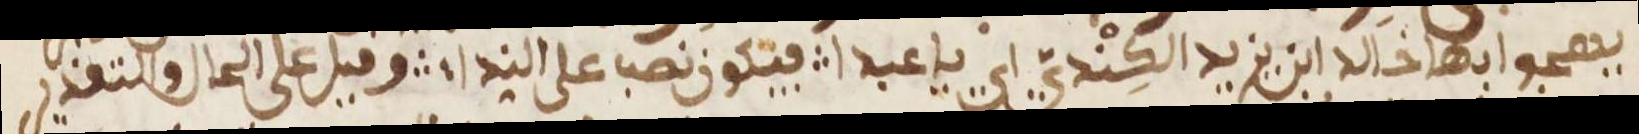يهجوا بها خالد ابن يزيد الكندي اي يا عبدا فيكون نصب على النداء و قيل على الحال و التقدير
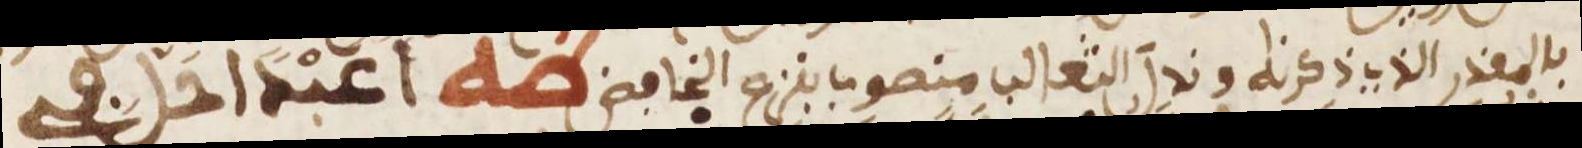بالمقدر الذي ذكرنٰه و ندل الثعالب منصوب بنزع الخافض طه أعبدا حل في
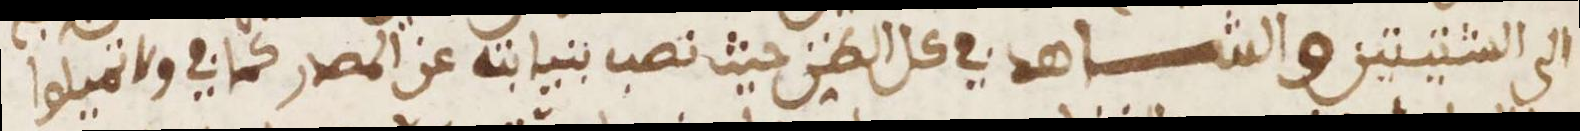الى الشتيتين و الشاهد في كل الظن حيث نصب بنيابته عن المصدر كما في و لا تميلوا
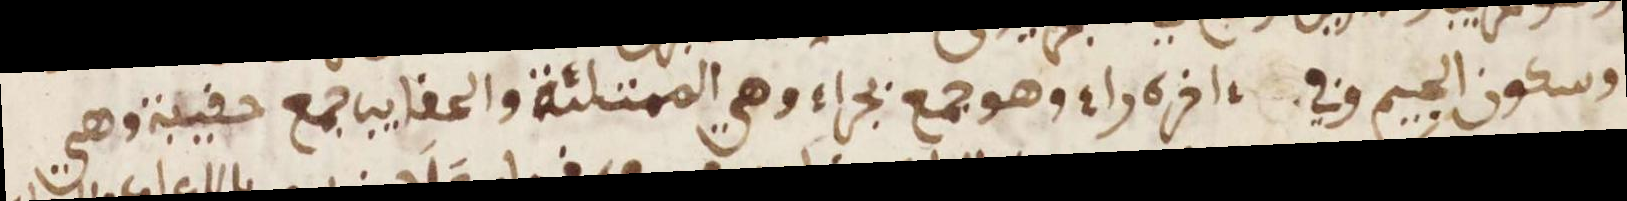و سكون الجيم و في أخره راء و هو جمع بجراء و هي الممتلئة والحقايب جمع حقيبة و هي
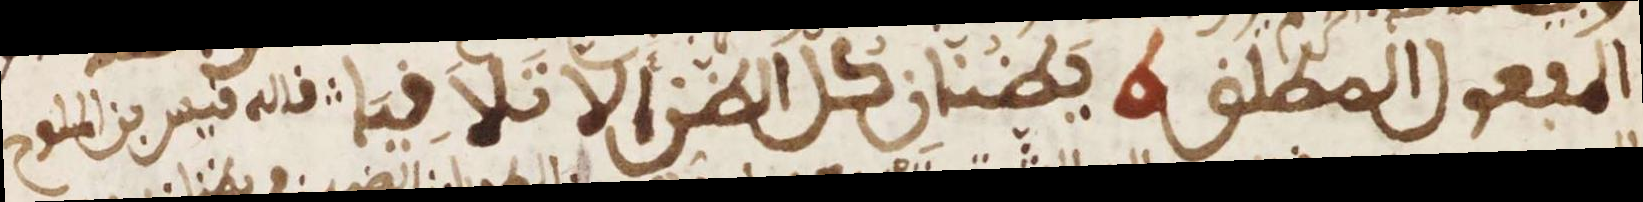المفعول المطلق ه يظنان كل الظن ألا تلاقيا قاله قيس بن الملوح
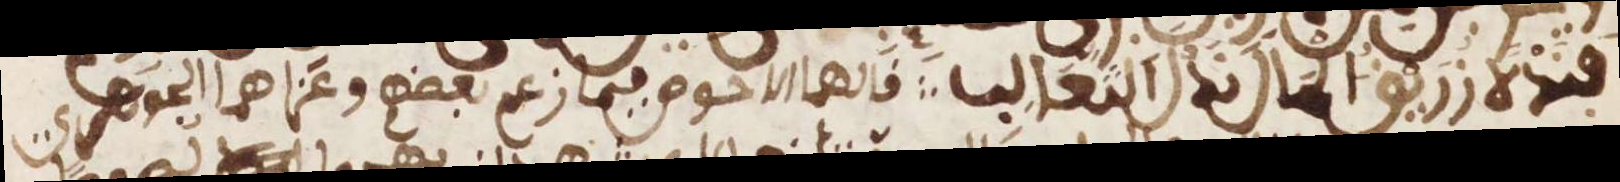فندلا زريق المال ندل الثعالب قالهما الاحوص فيما زعم بعضهم و عزاهما الجوهري
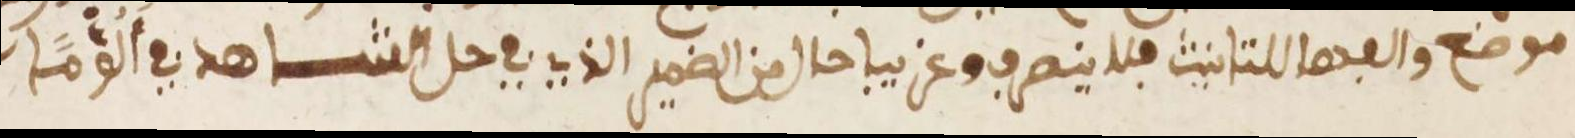موضع و الفها للتانيث فلا ينصرف و غريبا حال من الضمير الذي في حل الشاهد في ألؤما
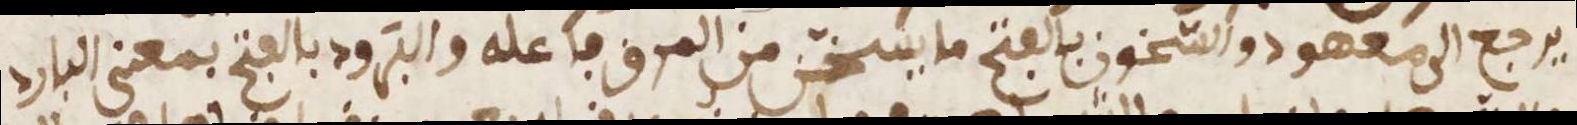يرجع الى معهود و السّخون بالفتح ما يسخن من المرق فاعله و البرود بالفتح بمعنى البارد
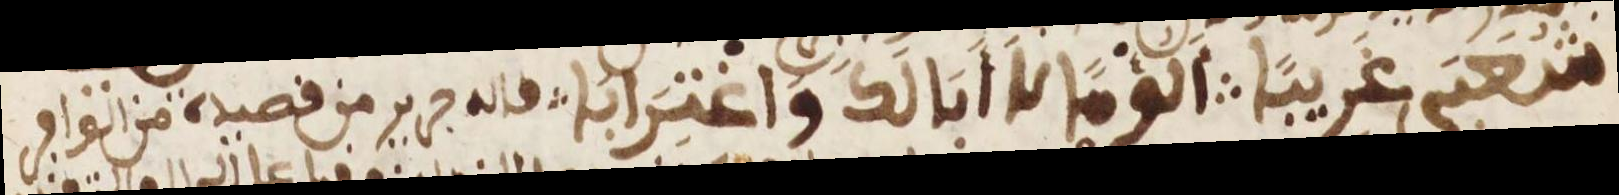شعبى غريبا ألؤما لا أبا لك و اغترابا قاله جرير من قصيدة من الوافر
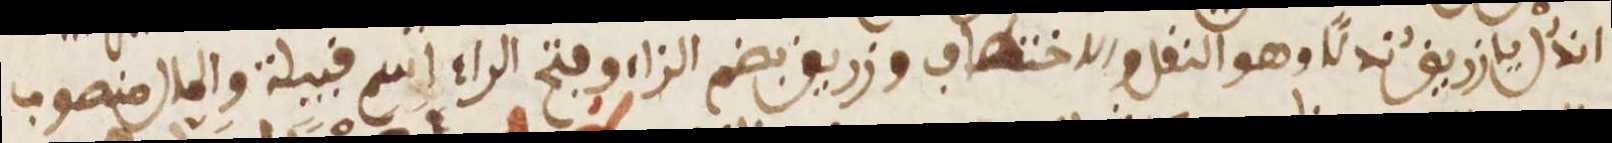اندل يا زريق ندلا و هو النقل و الاختطاف و زريق بضم الزاء و فتح الراء اسم قبيلة و المال منصوب
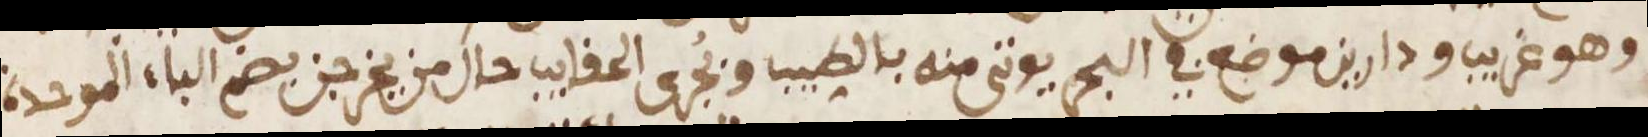و هو غريب و دارين موضع في البحر يوتى منه بالطيب و بجرى الحقايب حال من يخرجن بضم الباء الموحدة
